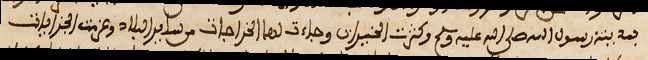بمدينة رسول الله صلى الله عليه وسلم وكثرت الخيرات وجاءت لها الخراجات من ساير البلاد وعزمت الجزايات
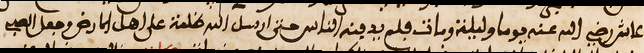عاشر رضي الله عنه يوما وليلة ومات فلم يدفنه الناس حتى ارسل الله ظلمة على اهل الارض وجعل الصبى
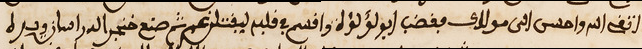اتقى الله وا حسن الى مولاك فغضب ابو لؤلؤة واقسم في قلبه ليقتلن عمر ثم صنع خنجرا له راسان ويده
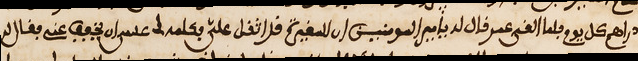دراهم كل يوم فلما القى عمر قال له يامير المومنين ان للمغيرة فد اثقل على فكلمه لى عسى ان يخفف عنى فقال له
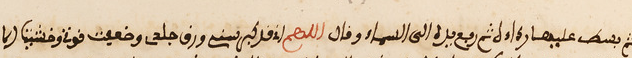ثم بسط عليها رداءه ثم رفع يده الى السماء وقال اللهم انى قد كبر سنى ورق جلدى وضعفت قوتى وخشيت الا
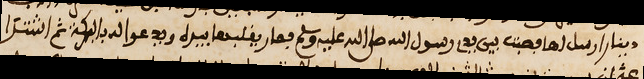دينار ارسل لها فصبت بين يدى رسول الله صلى الله عليه وسلم فصار يقلبها بيده ويدعوا له بالبركة ثم اشترا
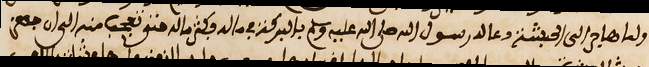ولما هاجر الى الحبشة دعا له رسول الله صلى الله عليه وسلم بالبركة في ماله فكثر ما له حتى تعجب منه الى ان جععز
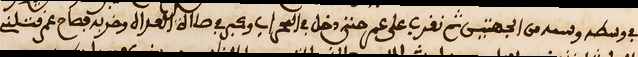في وسطه وسمه من الجهتين ثم نقرب على عمر حتى دخل في المحراب وكبر في صلاة العداه وضربه فصاح عمر قتلنى
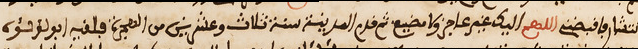نتشار فاقبضنى اللهم اليك غير عاجز ولا مضيع ثم قدم المدينة سنة ثلاث وعشرين من الهجرة فلقيه ابو لؤلؤه
